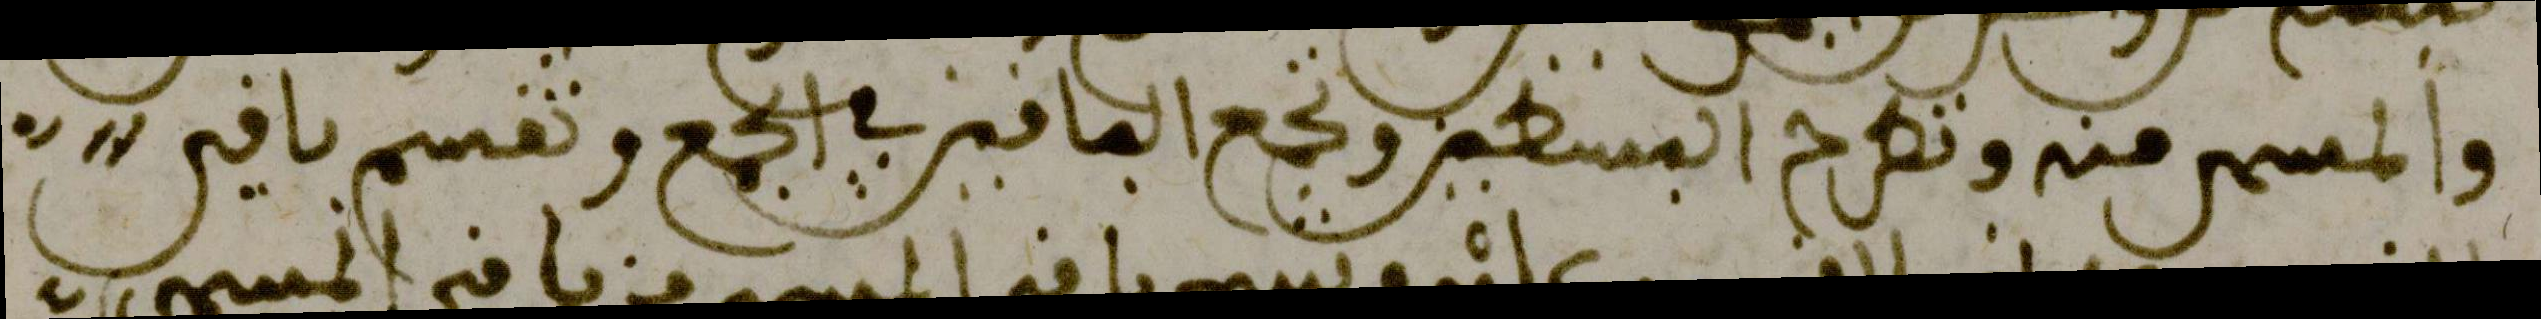والمسمى منه وتطرح البسطين وتجمع الباقين في الجمع وتقسم باقي
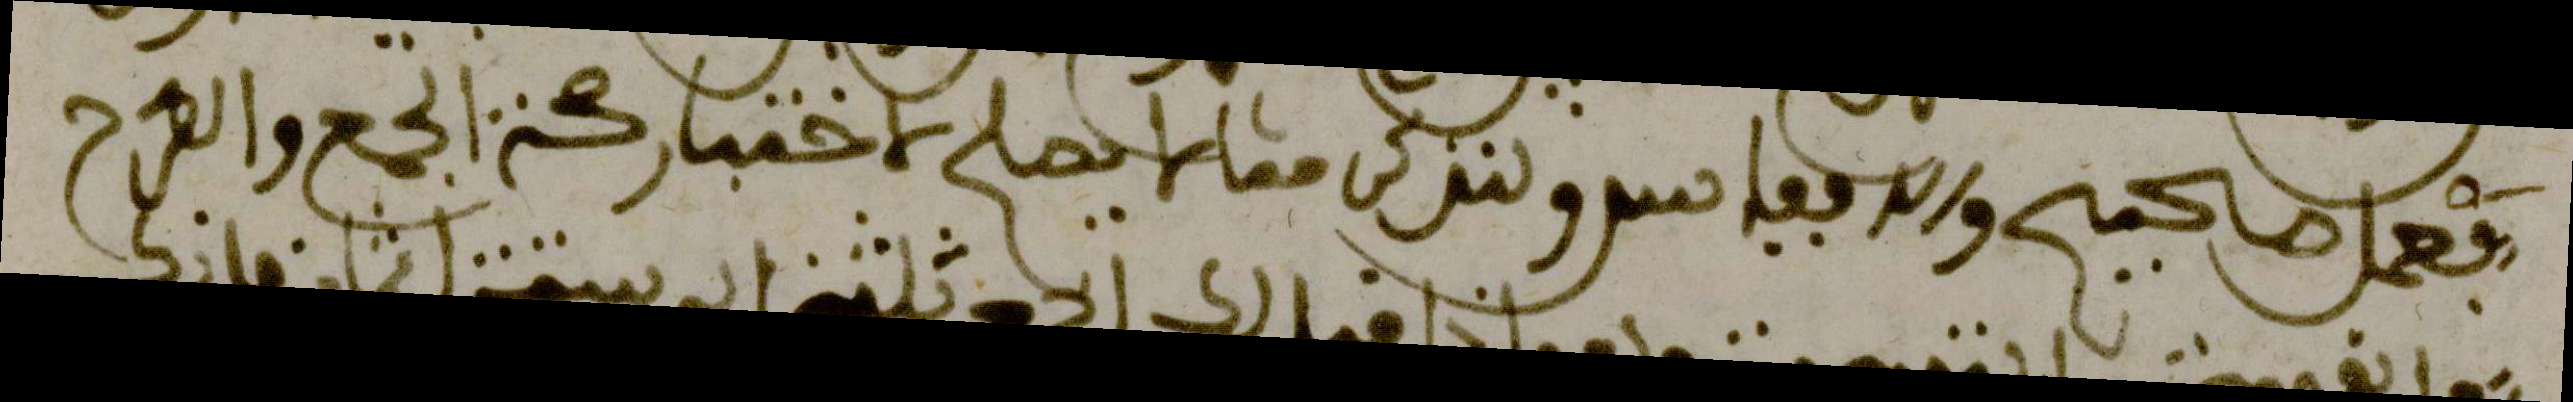فعمل صحيح والاففاسد ولنذكر مثالا يصلح لاختبار صحة الجمع والطرح
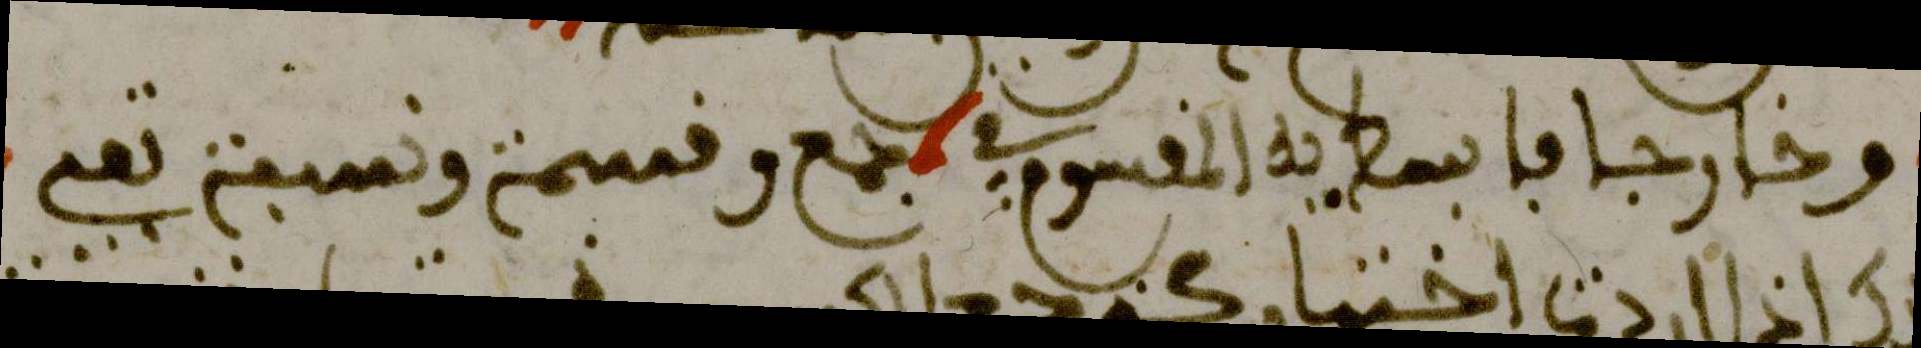وخارجا فابسط يك المقسوم في جمع وقسمة ونسبة تفي
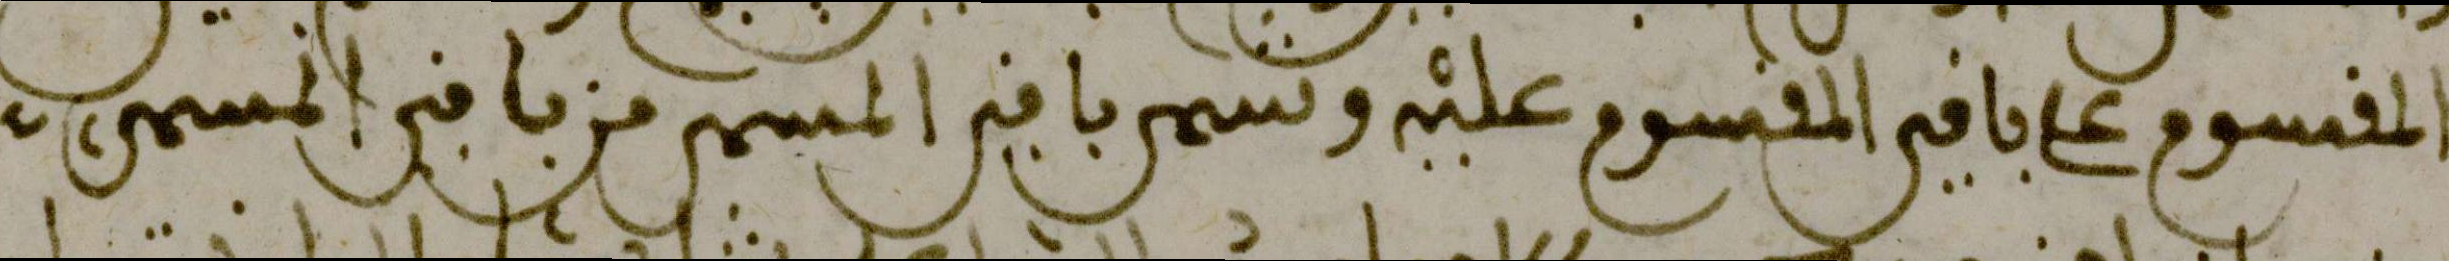المقسوم على باقي المقسوم عليْه وتسمى باقي المسمى من باقي المسمى
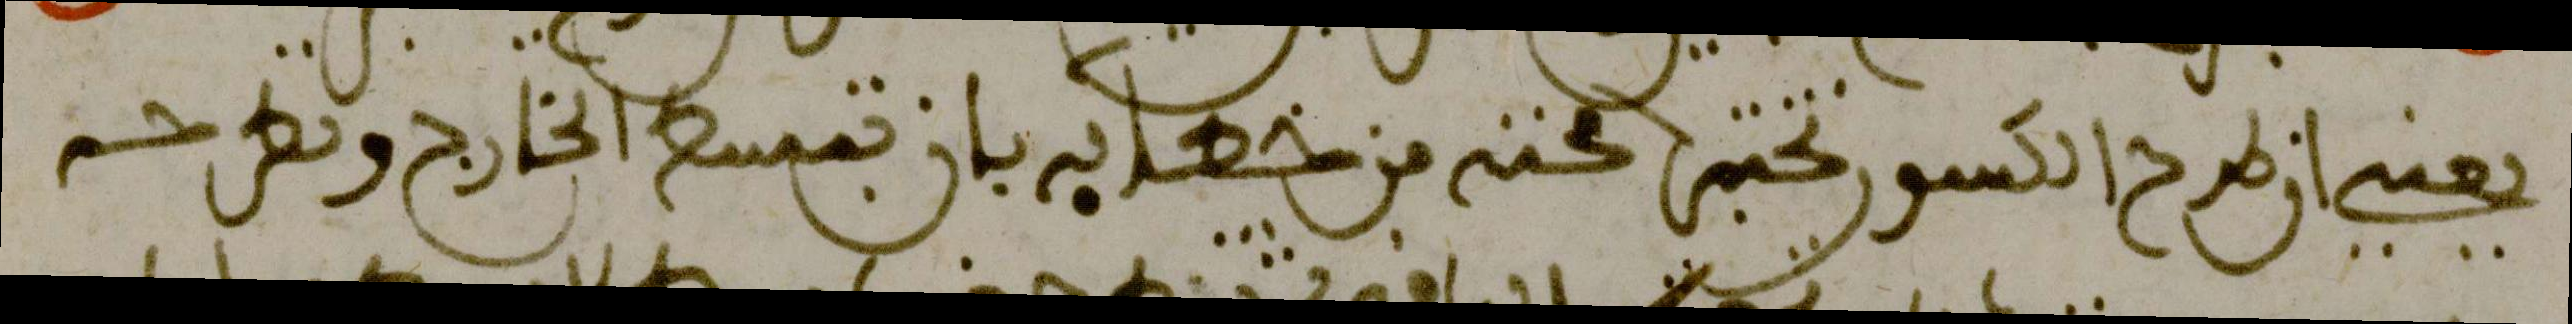يعني ان طرح الكسور تختبر صحته من خطائه بان تبسط الخارج وتطرحه
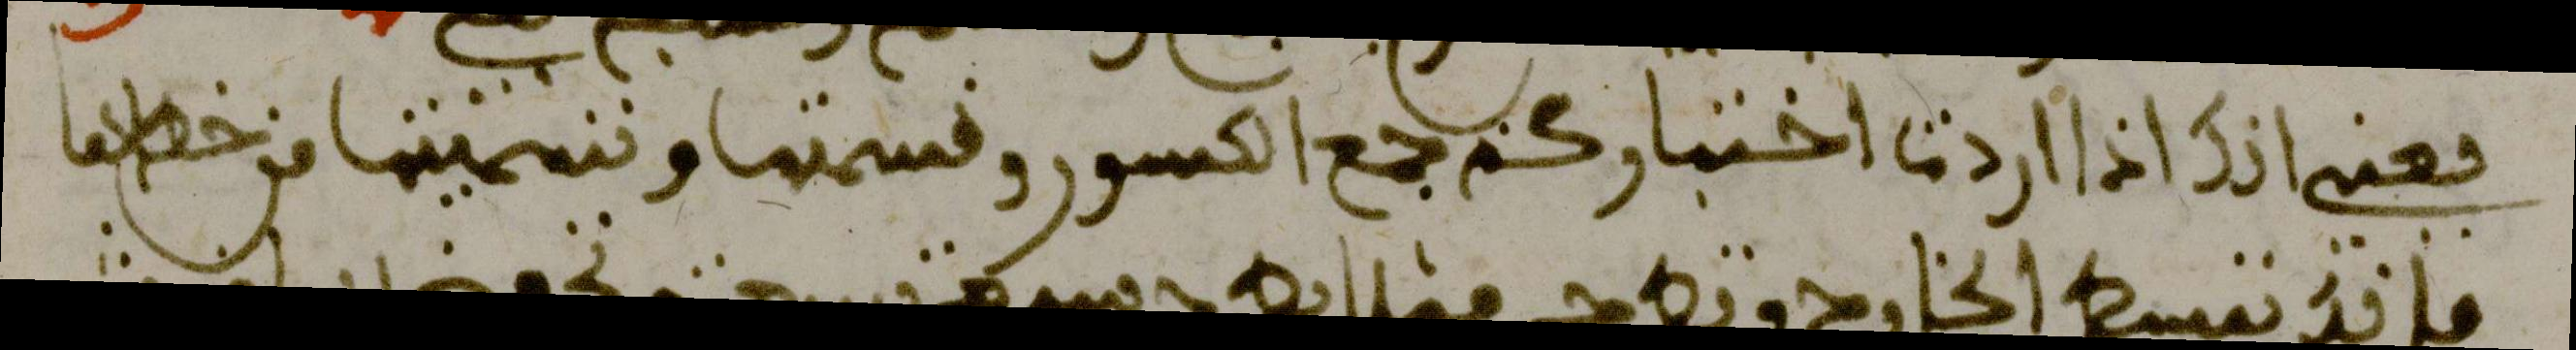يعني انك اذا اردت اختبار صحة جمع الكسور وقسمتها وتسميتها من خطاها
